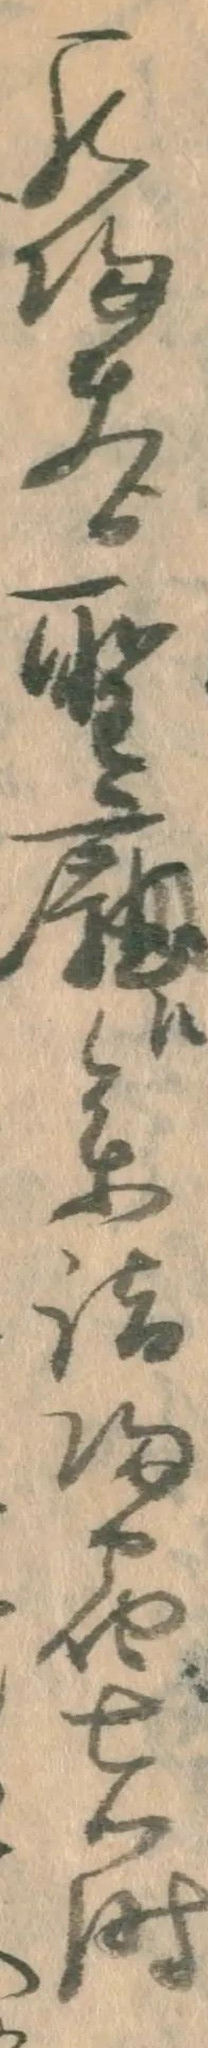罷帰夫ゟ聖庁江参詣帰宿七ツ時
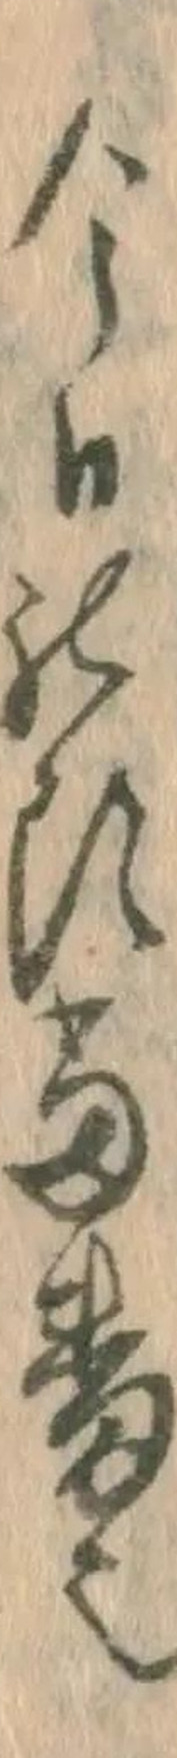今日社頭当番也
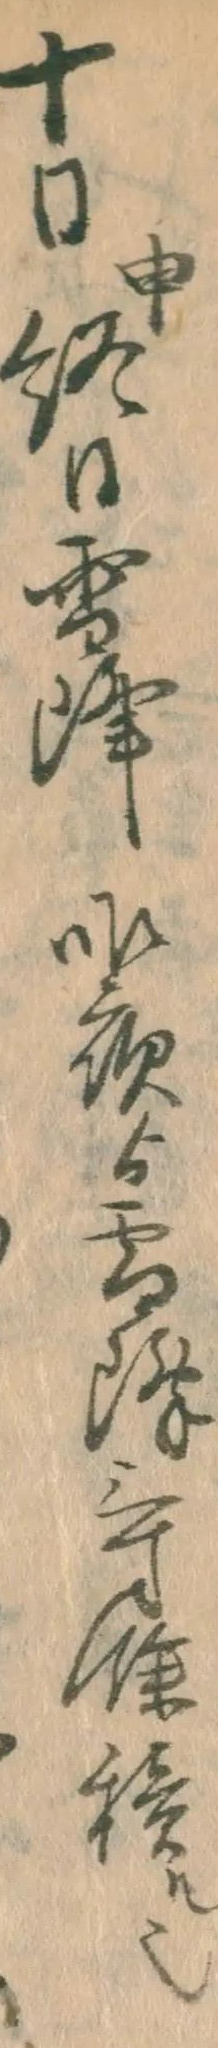十日申終日雪降昨夜ゟ雪降三寸余積ル也
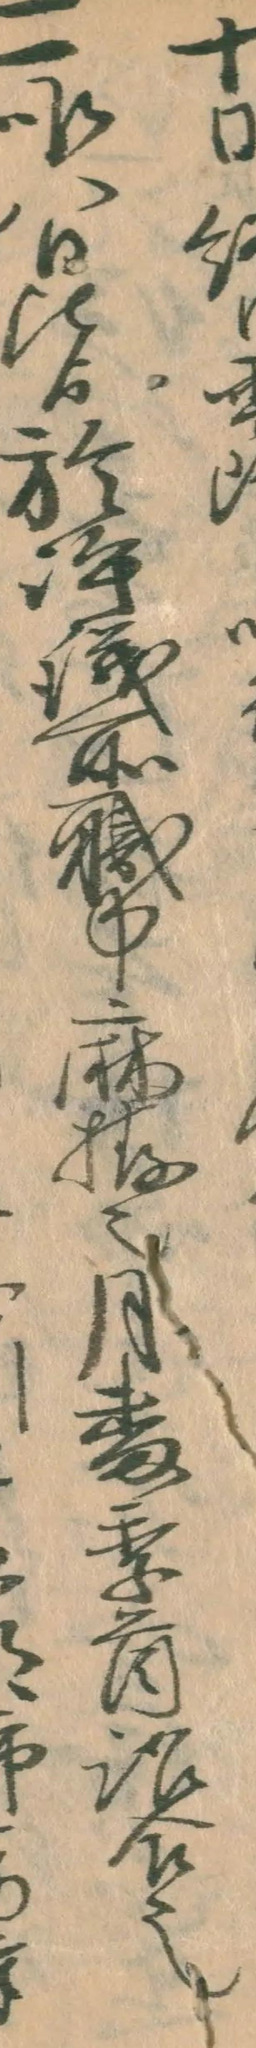一一昨八日比ゟ於評議所職中麻拵之月番季首詰合也
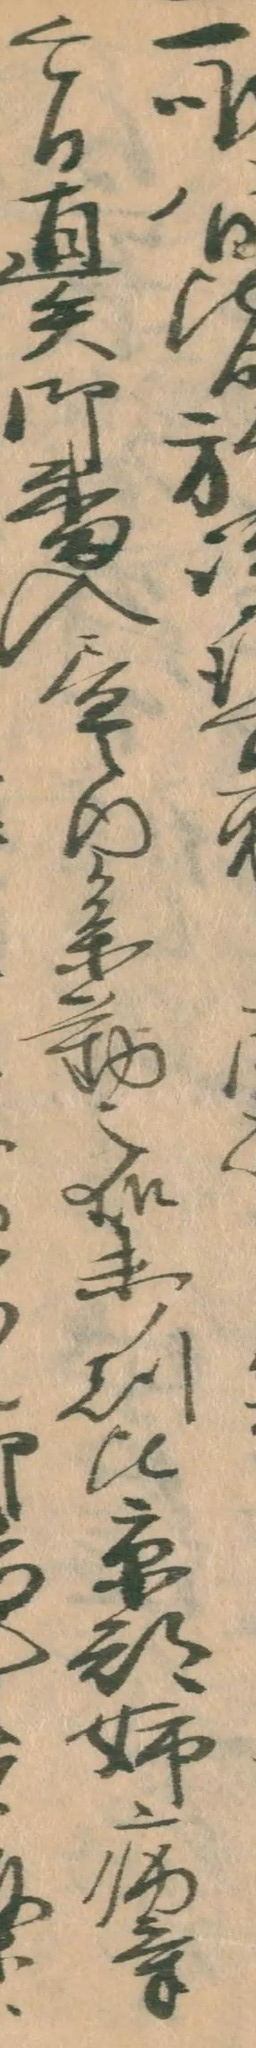今日直矢御番入昼之内参勤之様未ノ刻頃京都姉病気
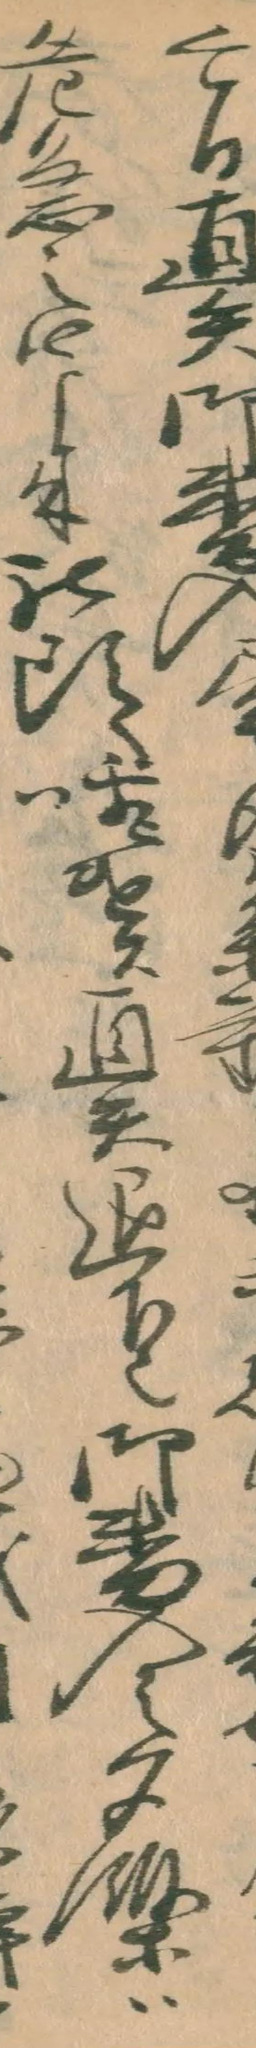危急之由申来社頭へ呼ニ遣ス直矢退下也御番入之夕飯等ハ
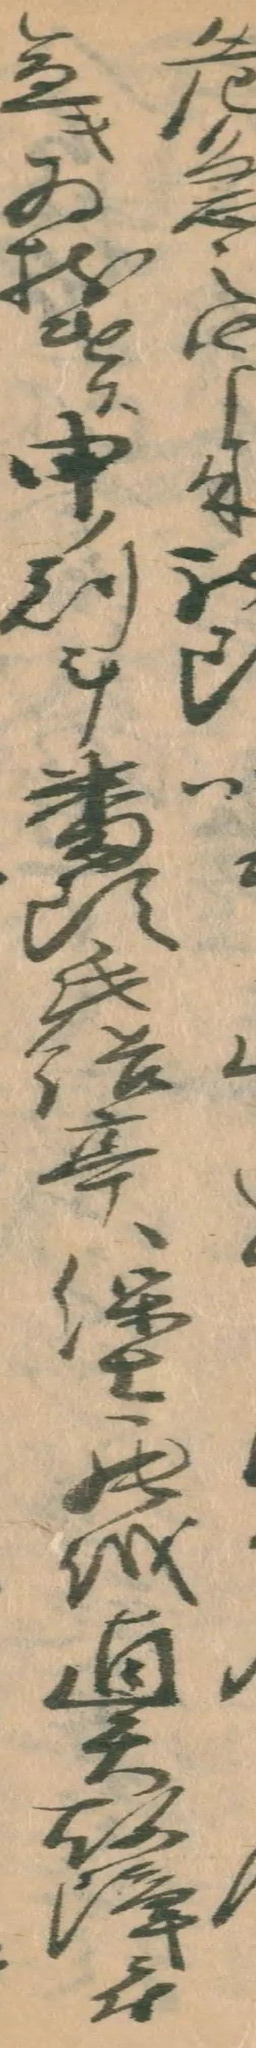キ為持遣ス申ノ刻斗番頭氏繕亭へ保士罷越直矢故障ニ付
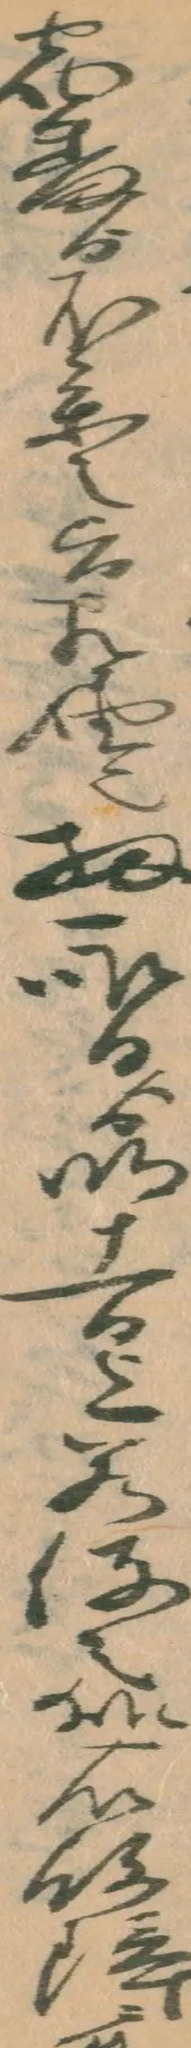宿番ゟ不参之旨相届也扨一昨日ゟ明十一日迄若役之処右故障ニ付
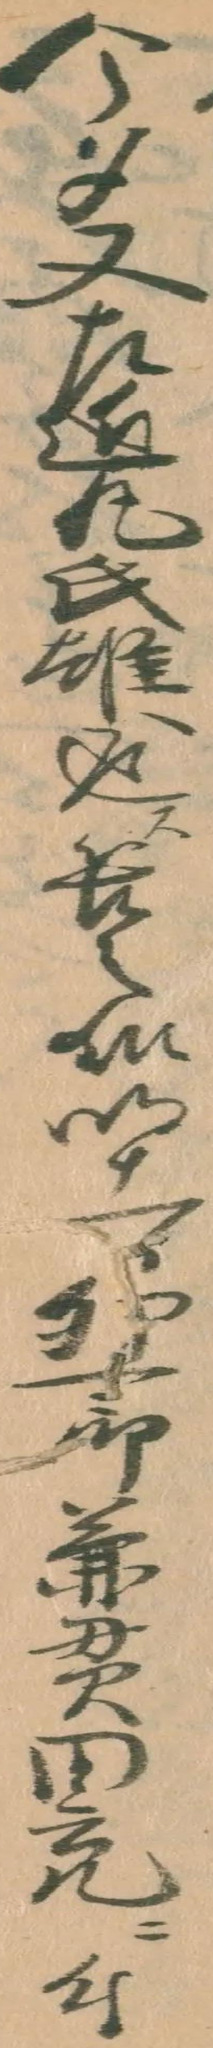今夕又左近丸氏雄へ返ス筈之処明十一日卯十郎兼貫田充ニ付
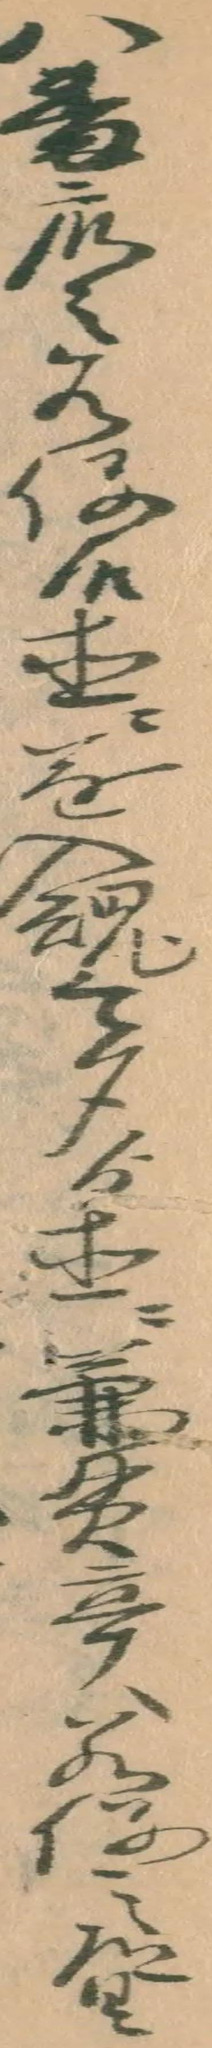八番衆之若役故直ニ遂入魂今夕ゟ直ニ兼貫亭へ若役之道具
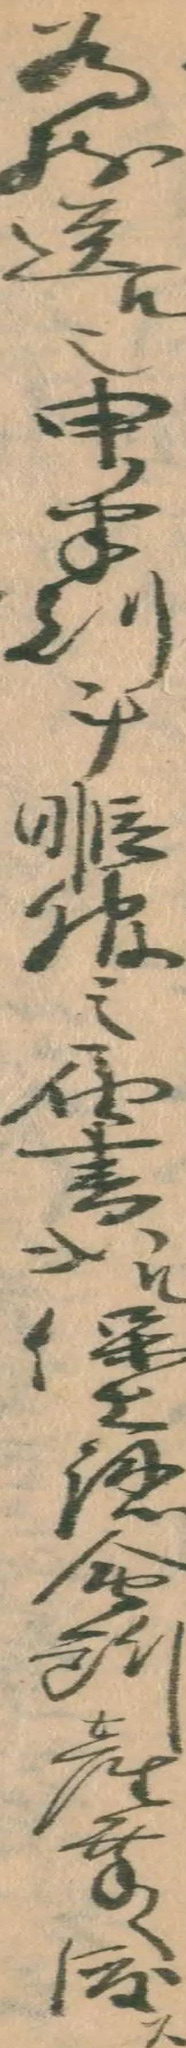為持送ル也申ノ半刻斗暇服之届書出ル保土認会所産幸へ渡ス
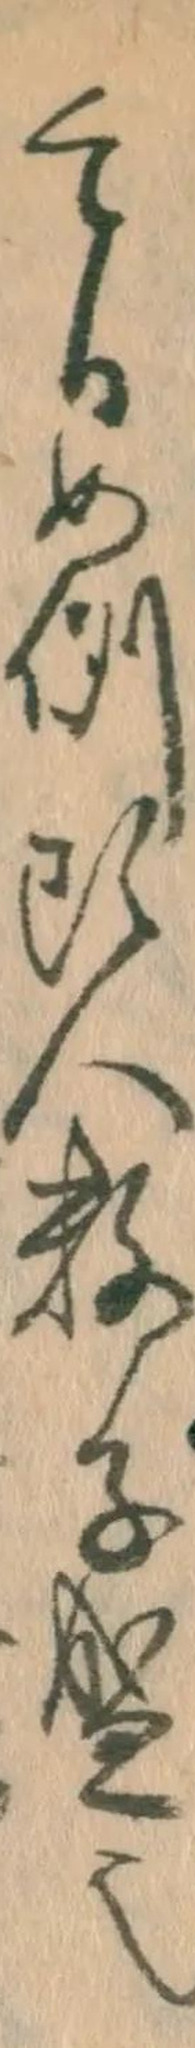今日如例頭人数子盛也
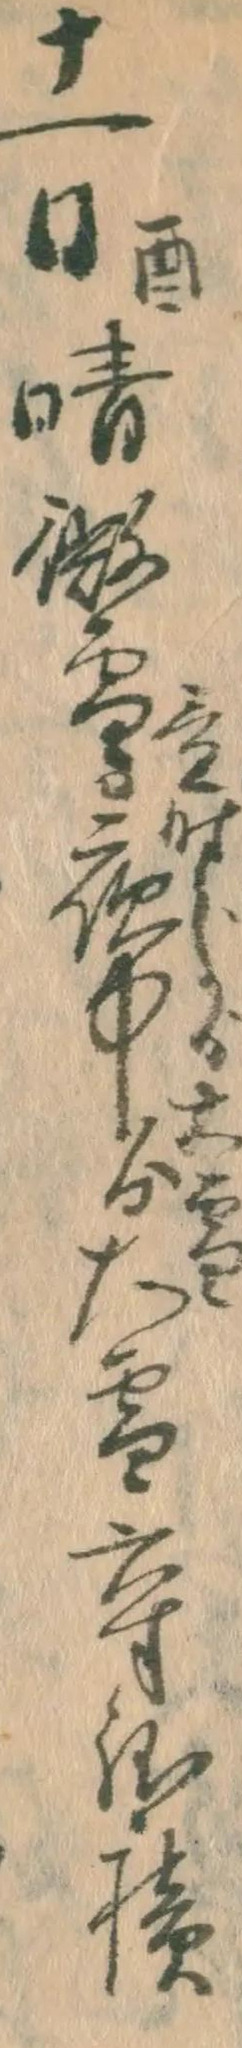十一日酉晴微雪夜中ゟ大雪六寸程積
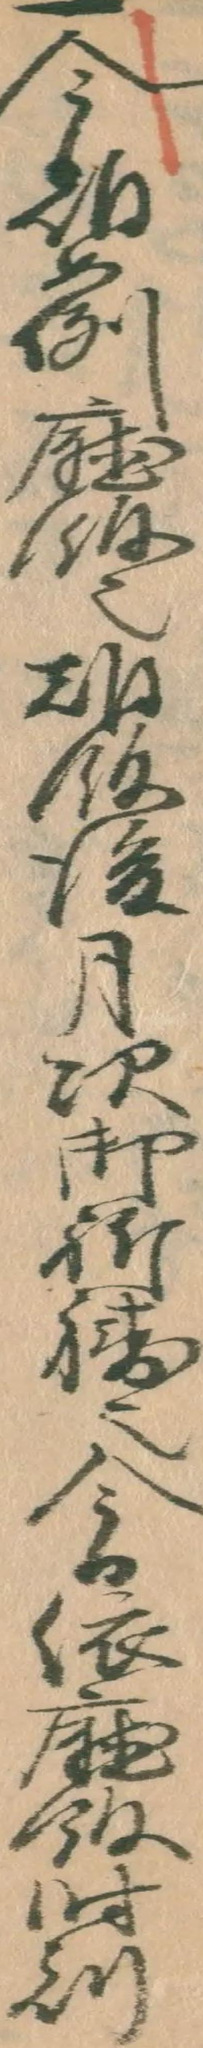一今朝如例庁飯也朝飯後月次御祈祷也今日依庁飯時刻
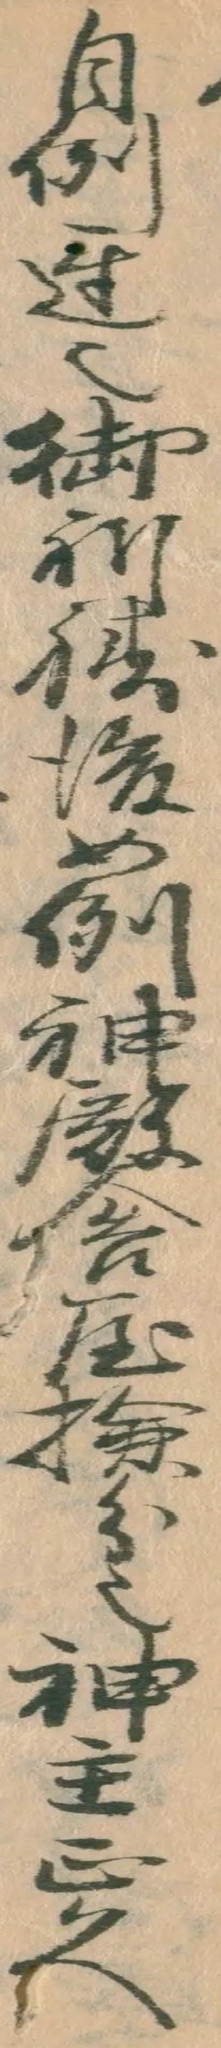自例遅也御祈祷後如例神殿舎屋検分也神主正久
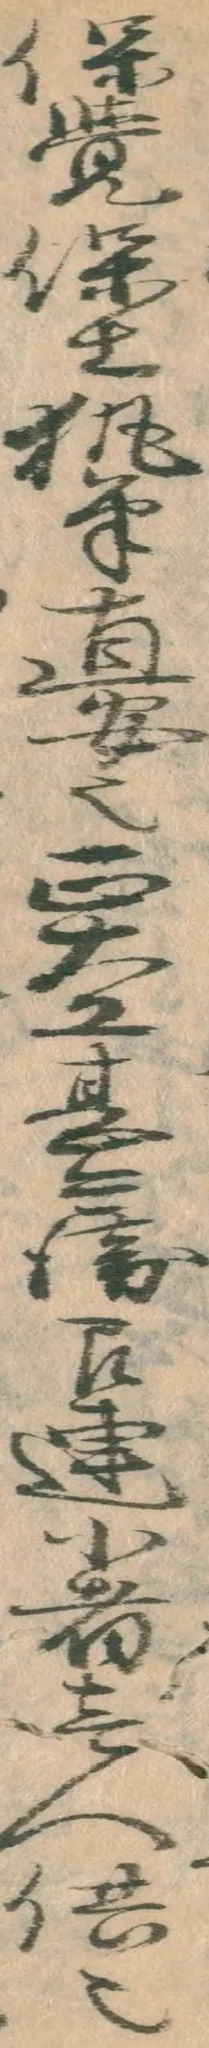保覚保土執筆直安也正大工甚兵衛召連小者壱人供也
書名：賀茂社記録. 第60冊
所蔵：国立国会図書館 National Diet Library, JAPAN
